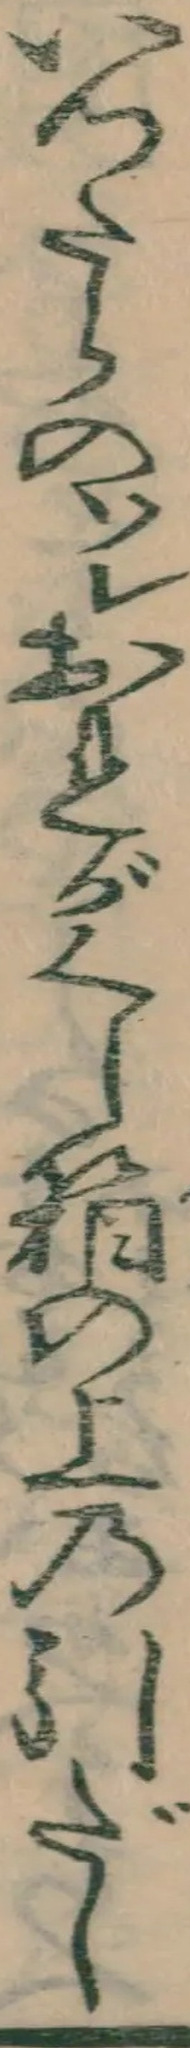いつたらのソレおれがくし箱の上の引だし
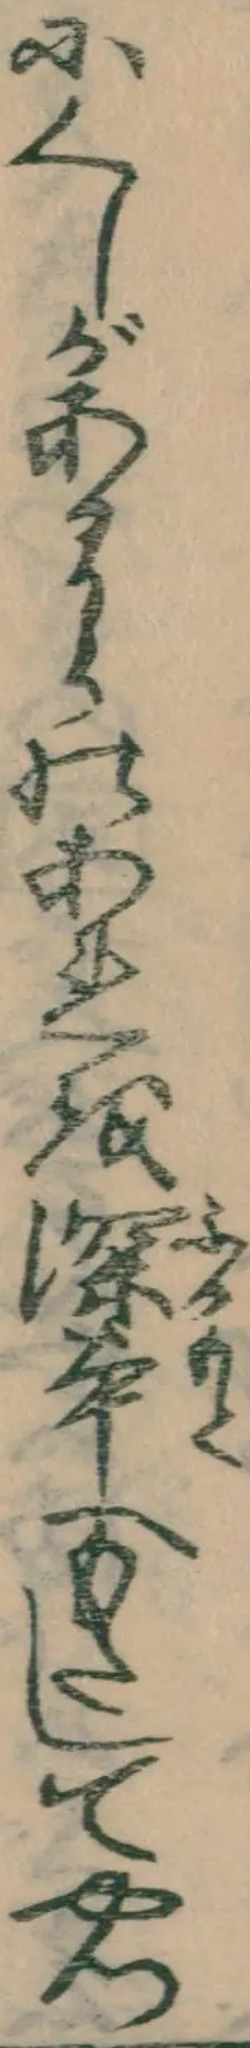にくしがあるからのあれを深本へもたしてやつ
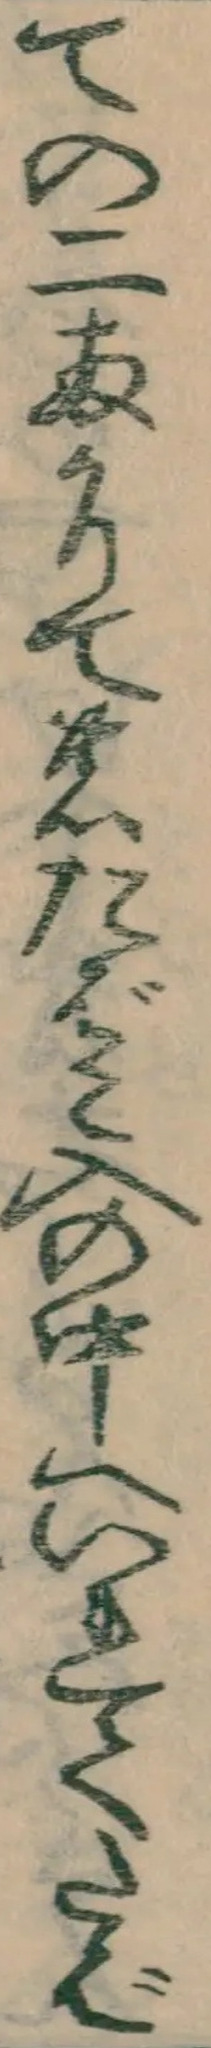ての二両かりてのたばこ入の中へいれてたば
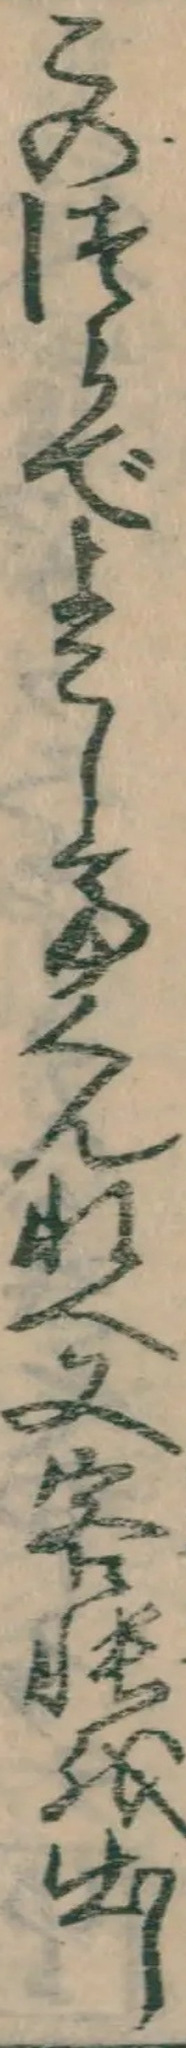このつらでよこしてくんねへ又客帳を出し
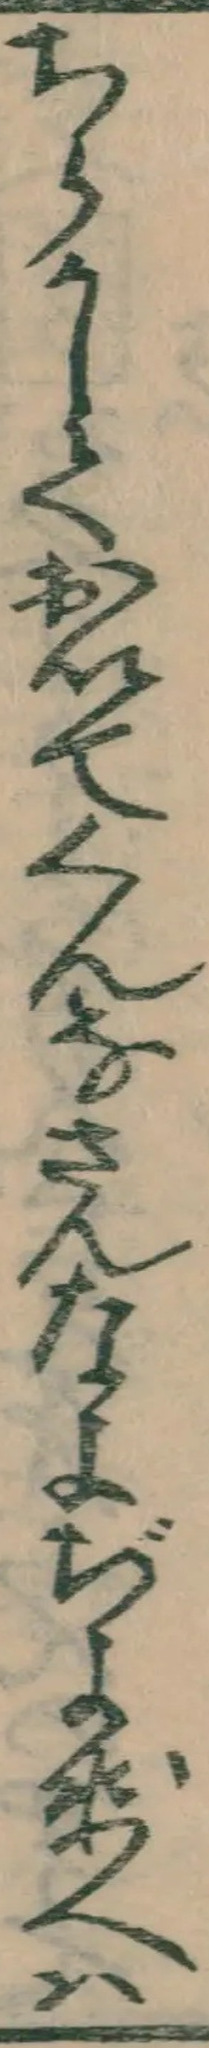ちらかしておいてくんなさんなよぢよせへは
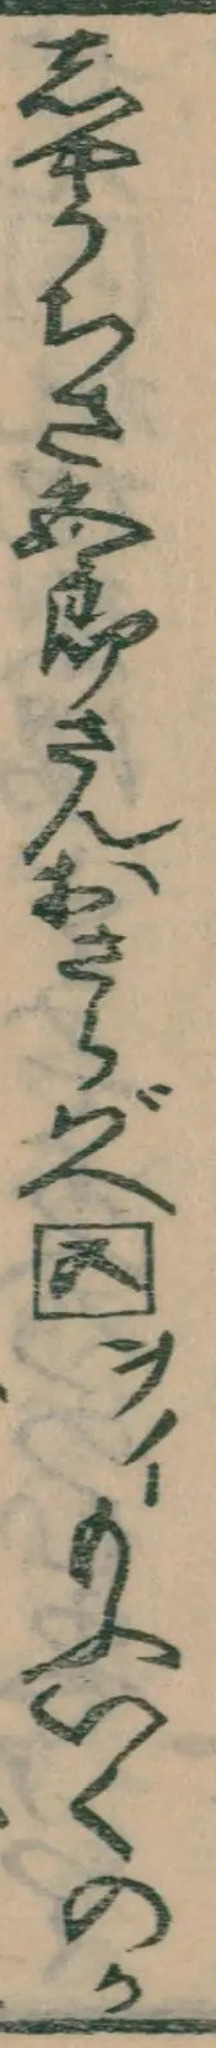しやうちさ五郎さんおさらばへ〈五〉ヲイもふいくのか
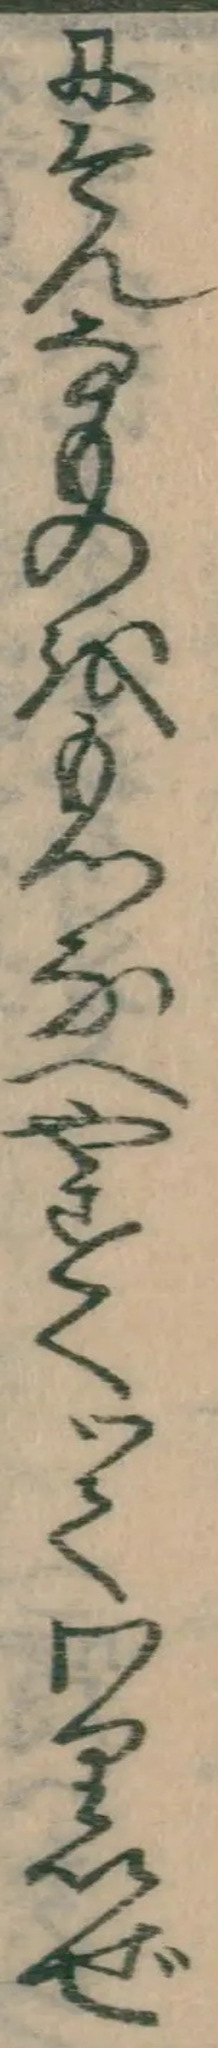にそんなものをもつなへやすくつてわりいぜ
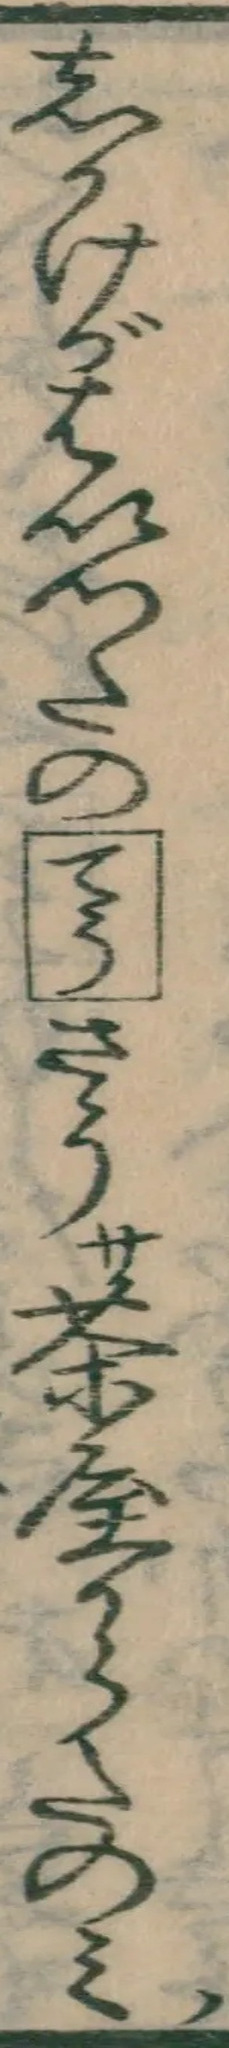しかけがはいつたの〈てう〉さうサ茶屋からたのみ
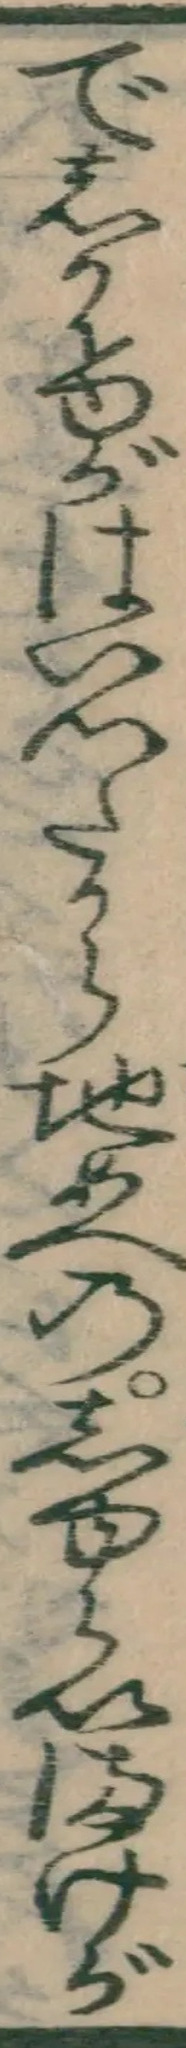でしかけがはいつたから地めへのてやいはしゆらいまけが
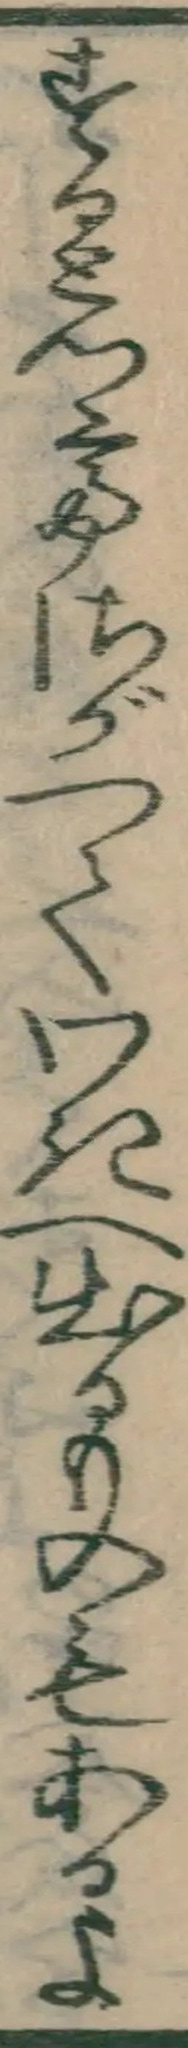するとつてさがつてわきへ出るものもあるよ
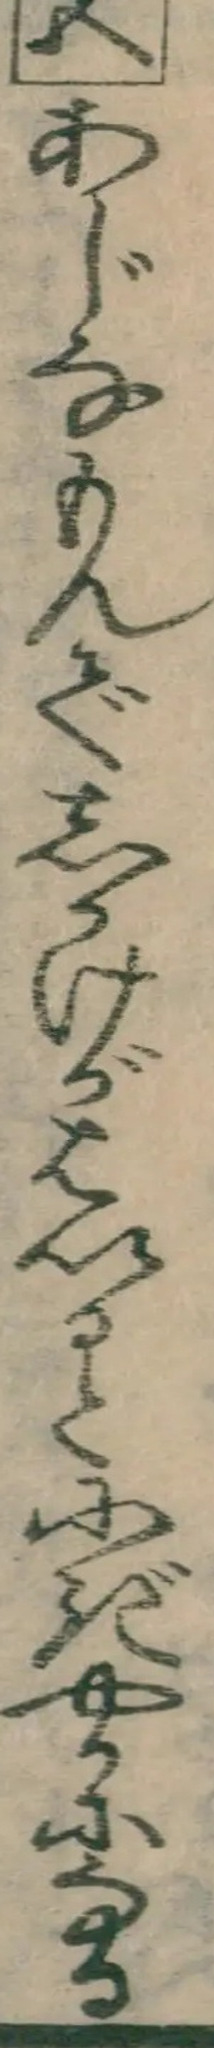〈五〉あじなもんでしかけがはいるとにぎやかになる

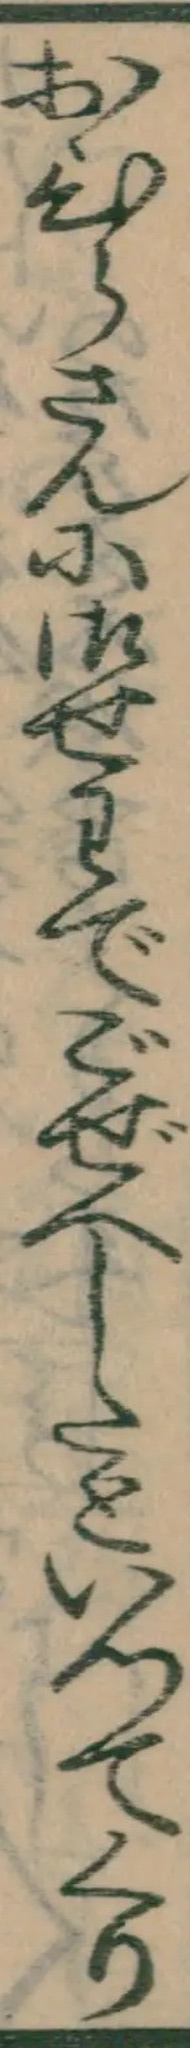おひらさんに御せわでごぜへしたといつてくり
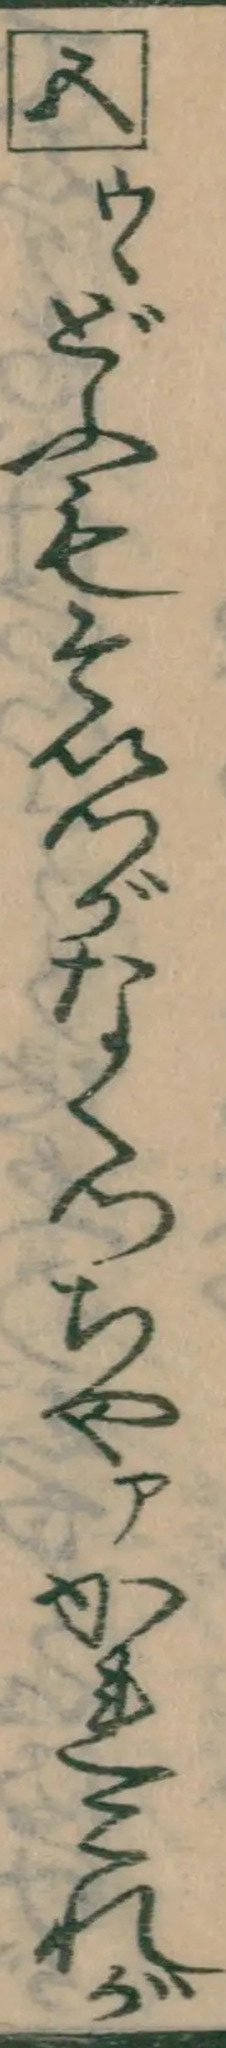〈五〉ウヽどふもそいつがなくつちやァかれこれが
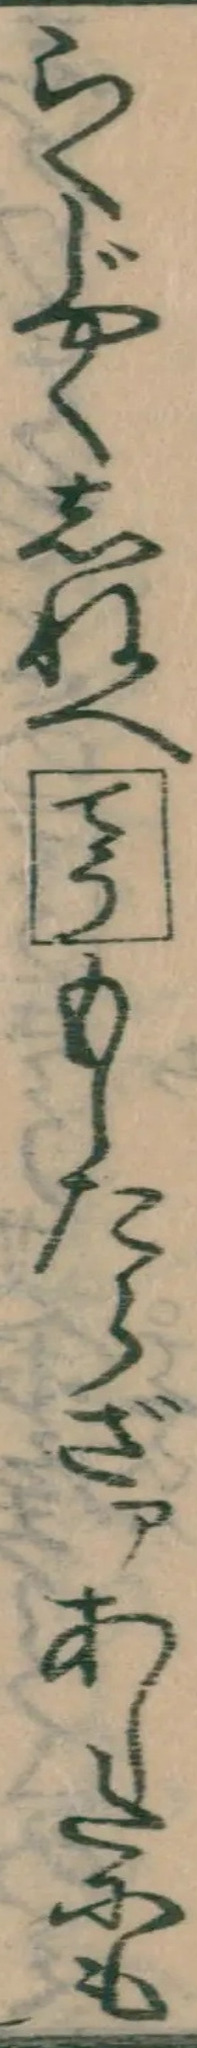らくじやくしねへ〈てう〉もしたらざァあしたにも
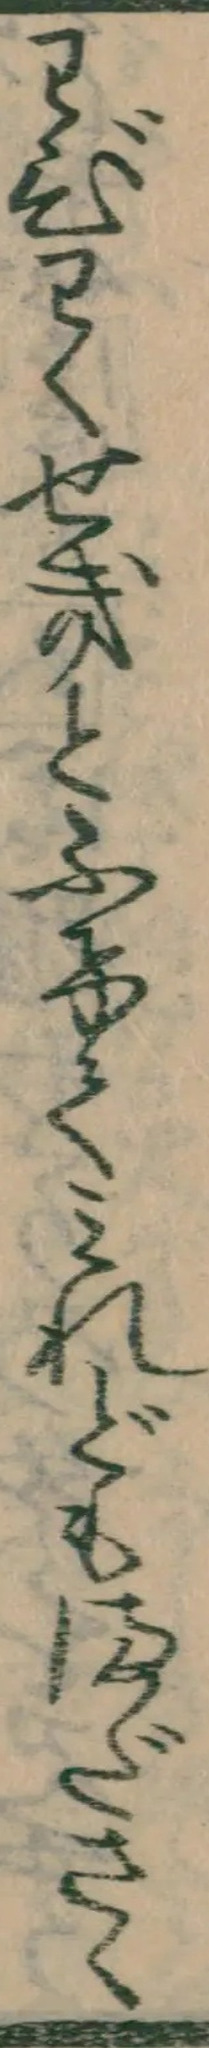わびわくせきとふけてみれどもまださゝ
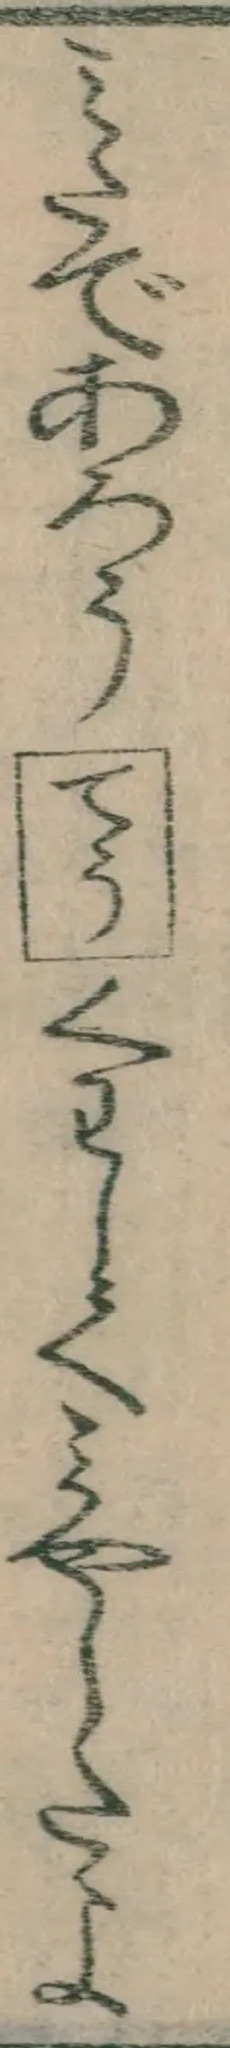みたであろう〈てう〉くわしくみやしたよ
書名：教訓読本：大礒風俗仕懸文庫
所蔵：国立国会図書館 National Diet Library, JAPAN
